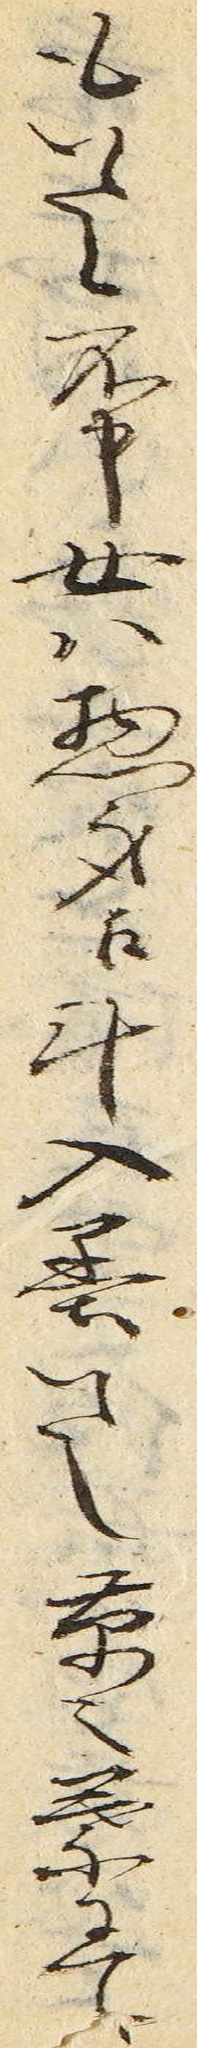もいたし不申女は惣身え斗入墨いたし草之葉にて

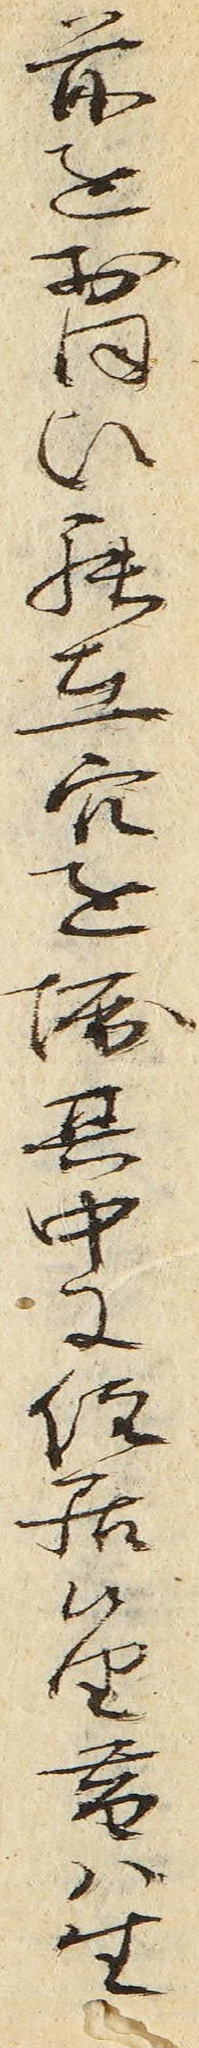前をおほひ罷在穴を掘其中に住居候由昔は生
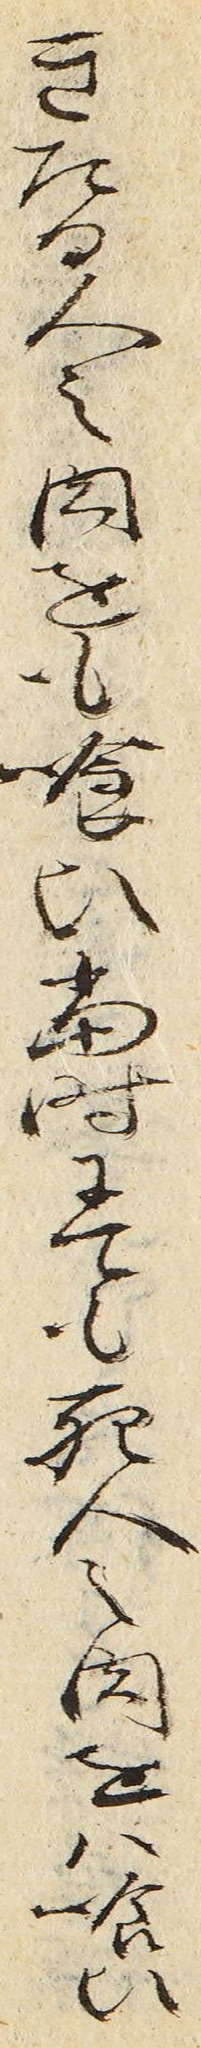きたる人之肉をも喰ひ当時にても死人之肉をは喰ひ
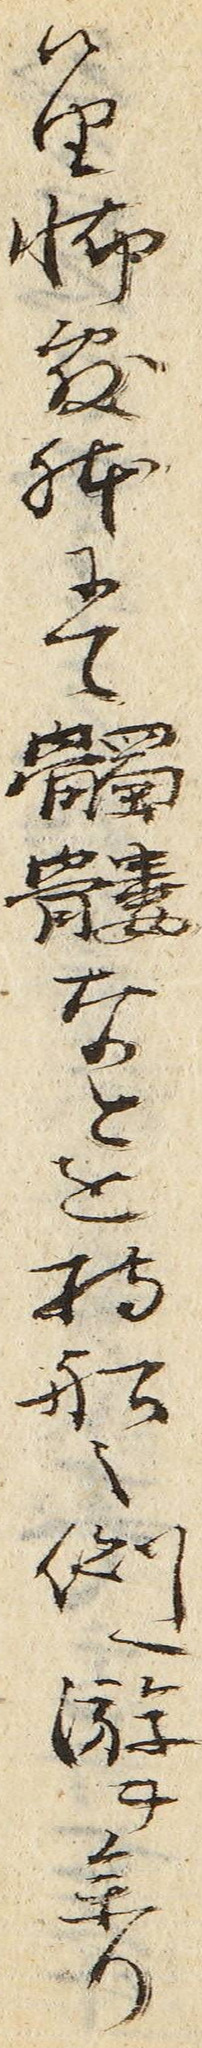候由怖敷体にて髑髏なとを持船之側へ游キ参り
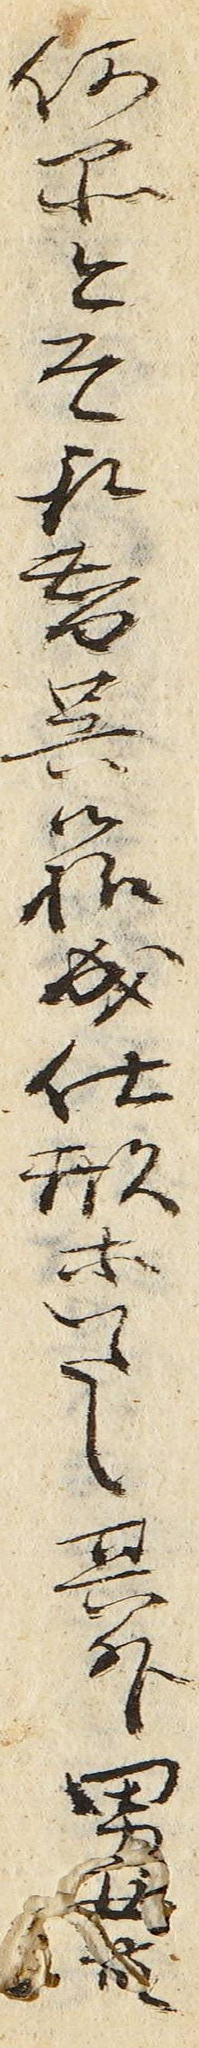何品とそ取替呉候様成仕形等いたし其外男女共
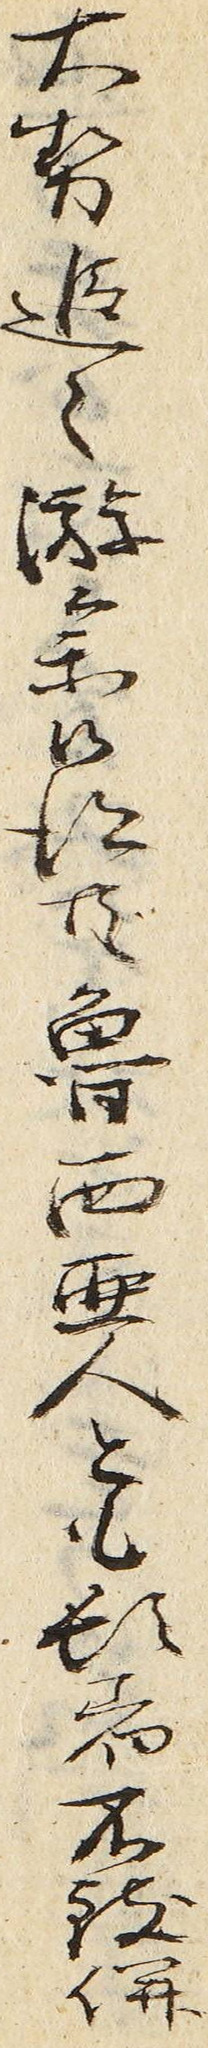大勢追々游参候得共魯西亜人とも頓着不致併
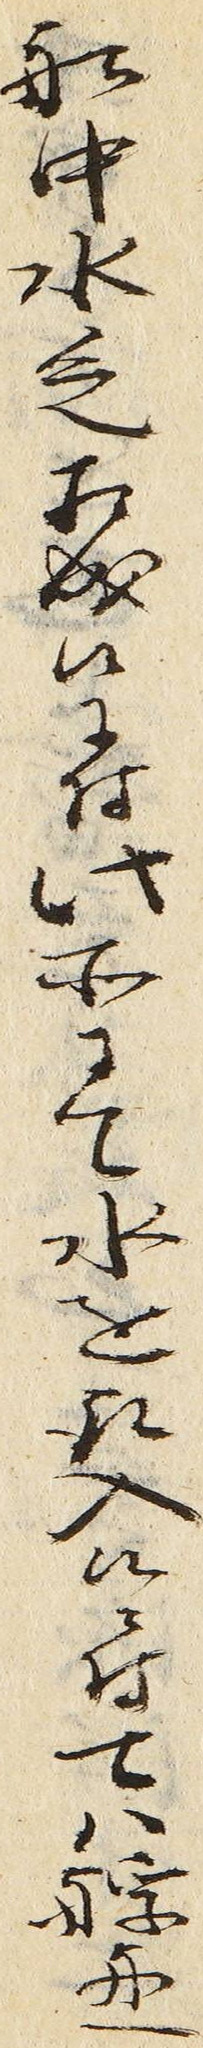船中水乏相成候に付此所にて水を取入候に付ては艀舟へ
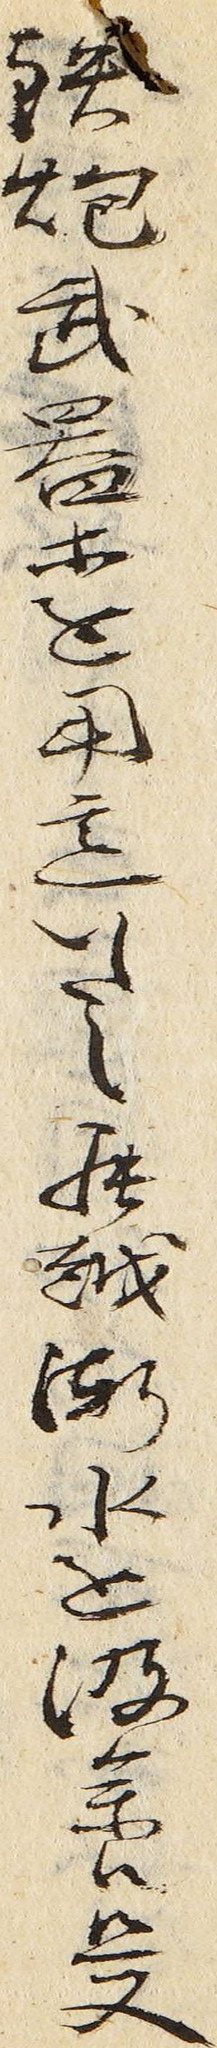鉄炮武器等を用意いたし罷越漸水を汲参候且又
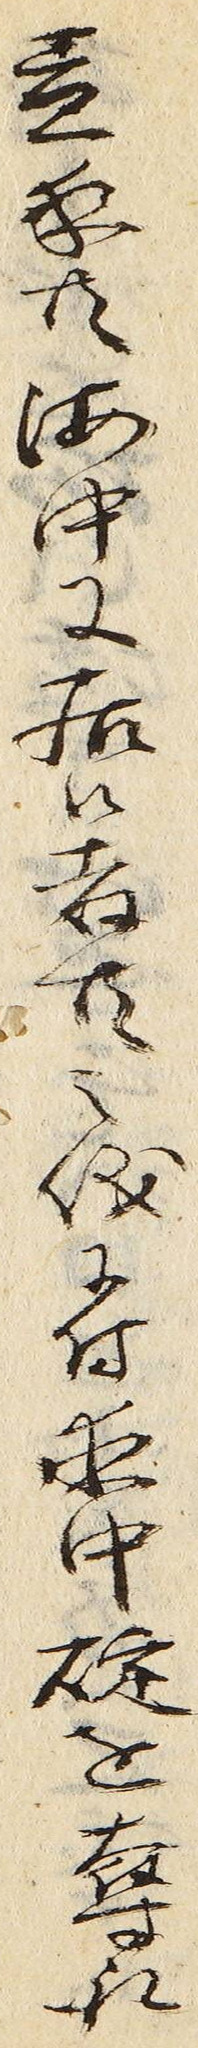昼夜共海中に居候者共之儀に付夜中碇を奪取
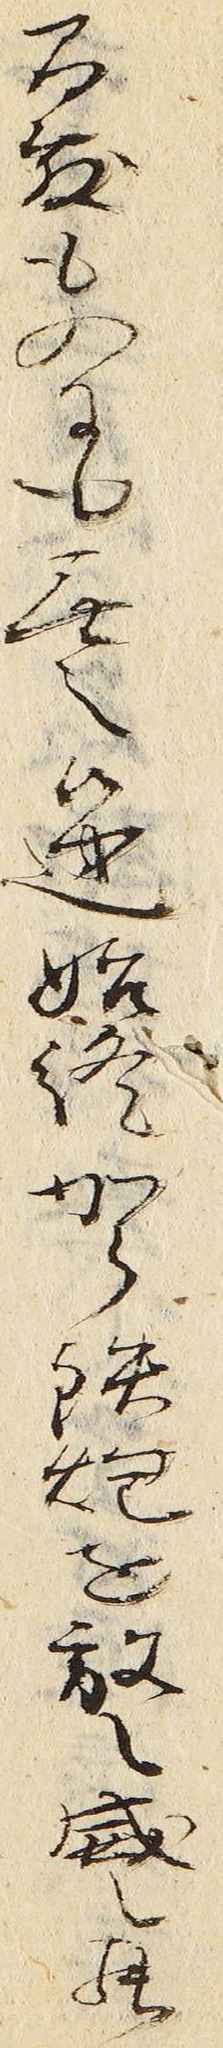間敷ものにも無之候迚始終から鉄炮を放し威し罷
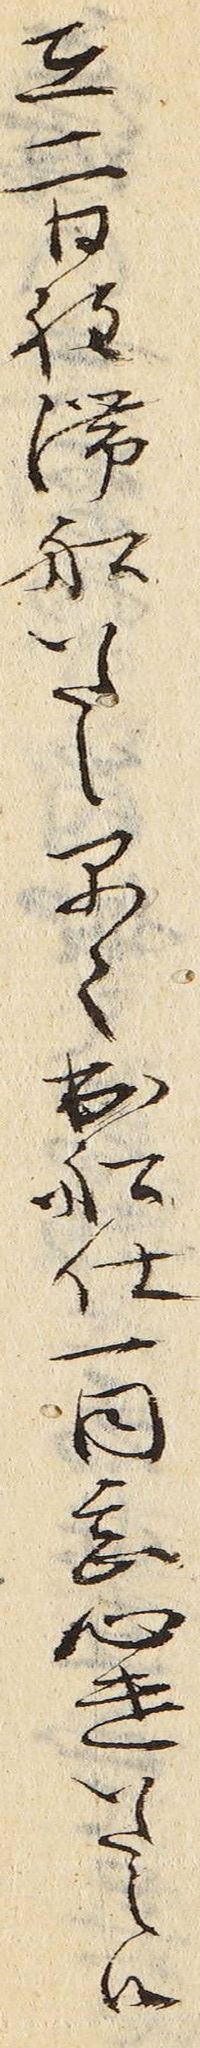在二日程滞船いたし早々出船仕一同甚心遣いたし候
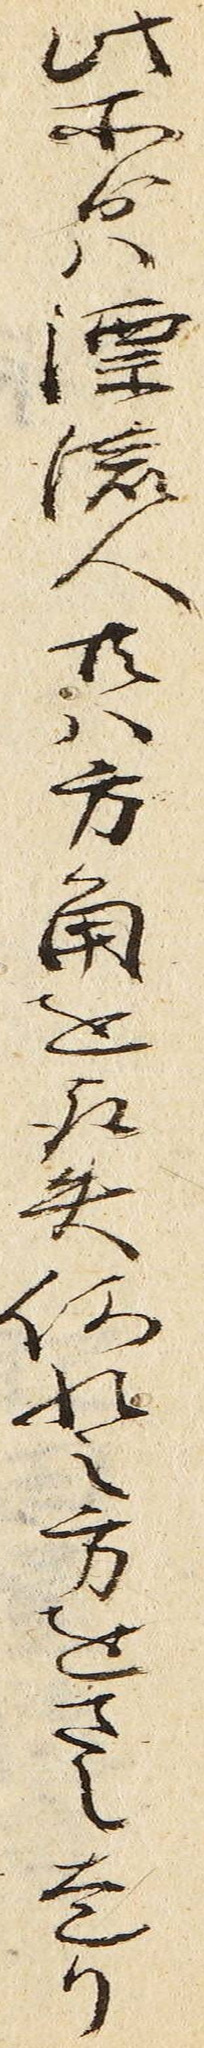此所ゟは漂流人共は方角を取失何れの方をさし走り
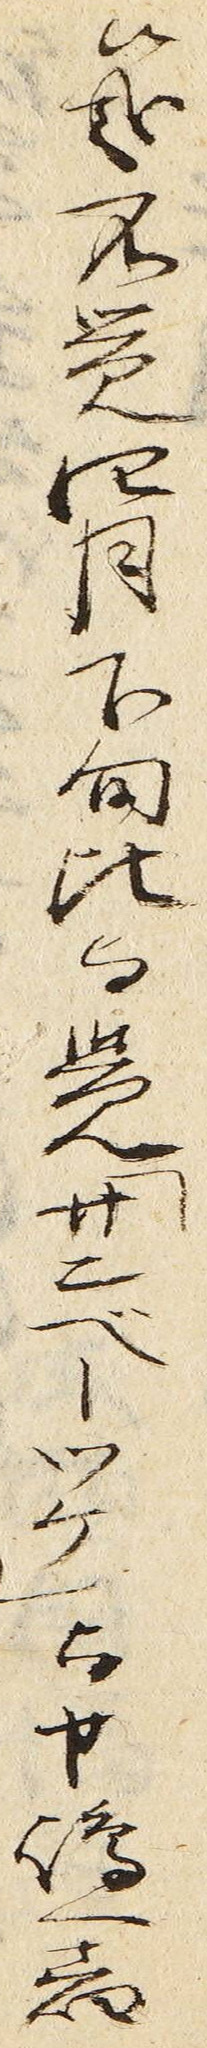候哉不覚四月下旬比と覚「サンベーツケ」と申島へ着
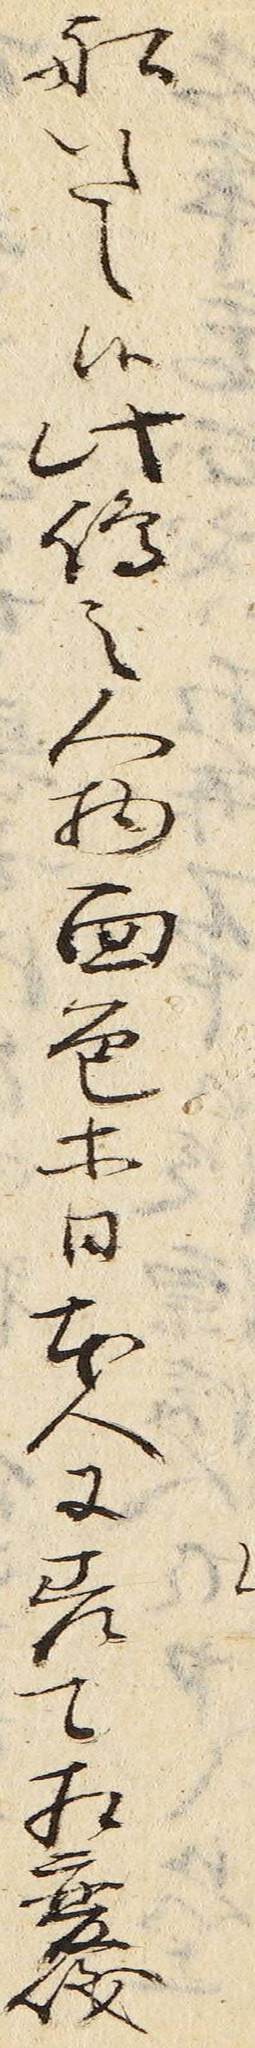船いたし候此島の人物面色等日本人に差て相変儀
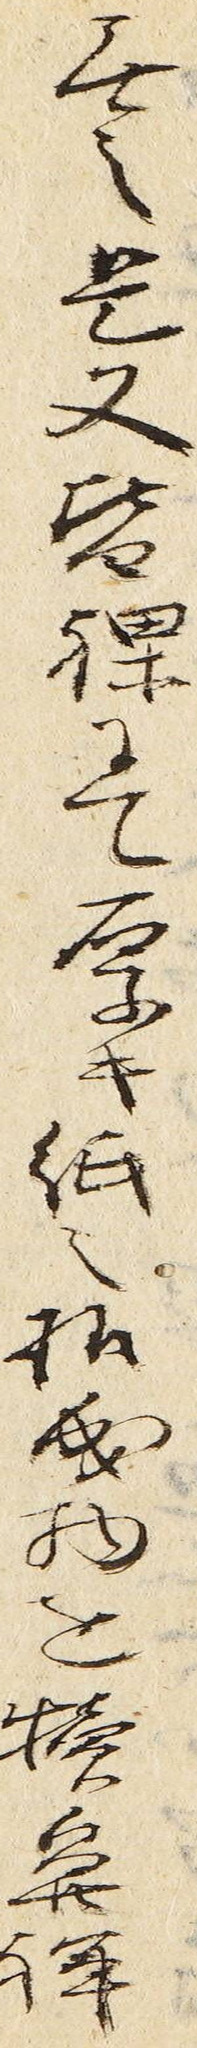無之是又皆裸にて厚キ紙之様成物を犢鼻褌
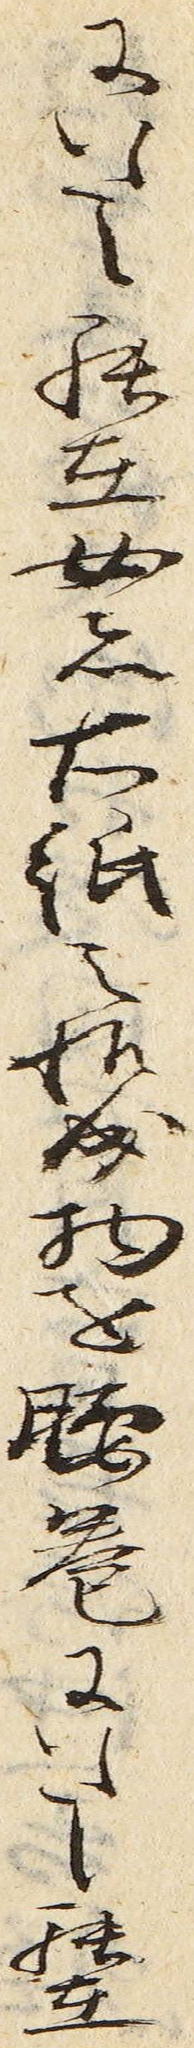にいたし罷在女は右紙之様成物を腰巻にいたし罷在
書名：漂民後記
